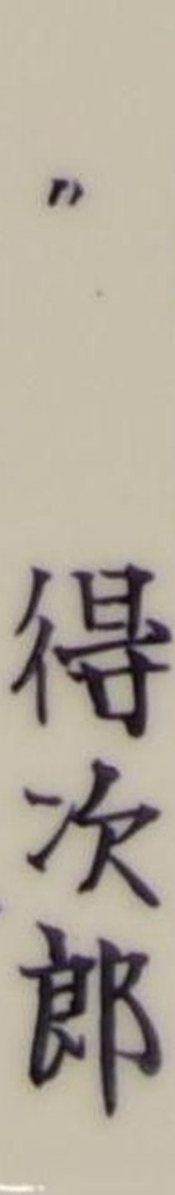得次郎
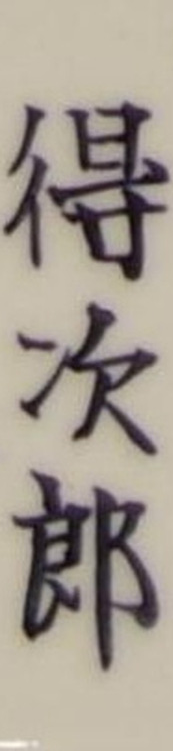得次郎
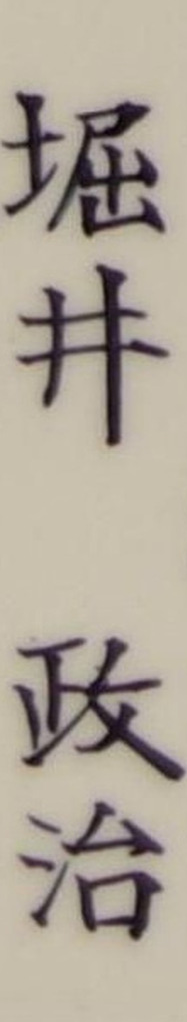堀井政治
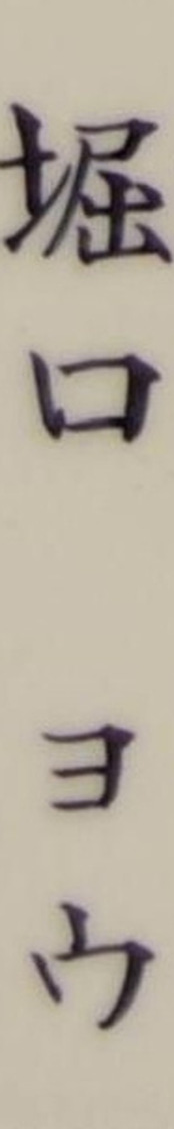堀口ヨウ
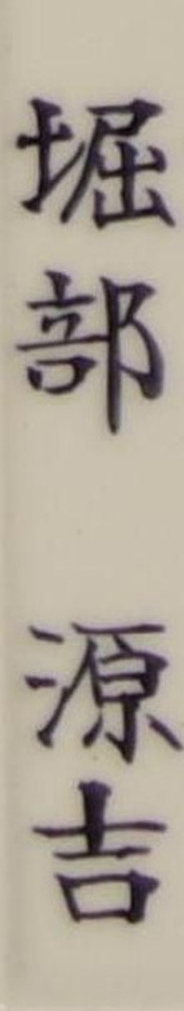堀部源吉

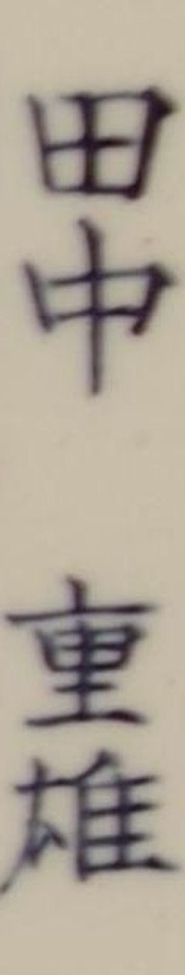田中重雄
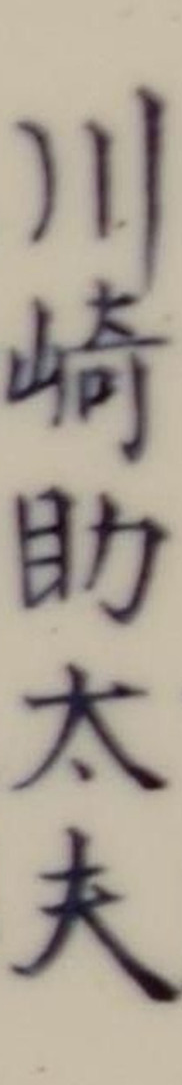川崎助太夫
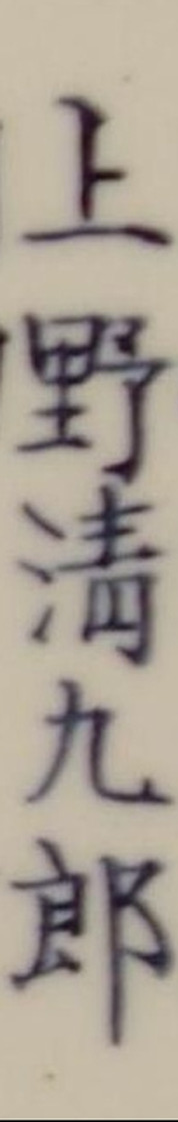上野清九郎
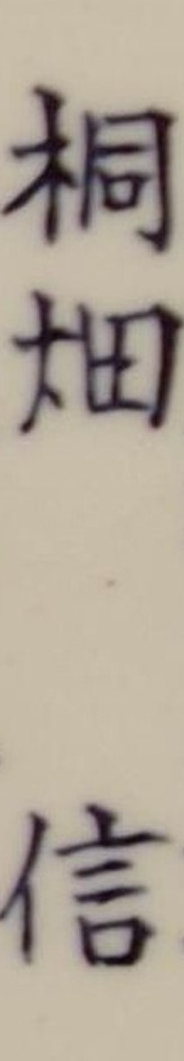桐畑信
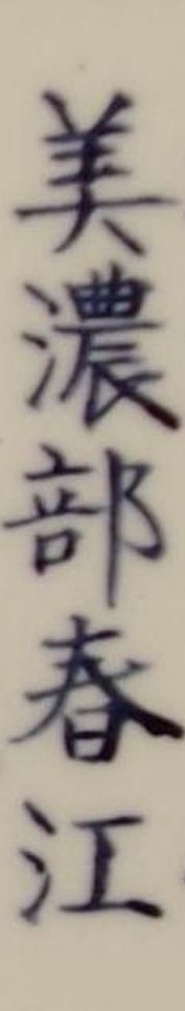美濃部春江
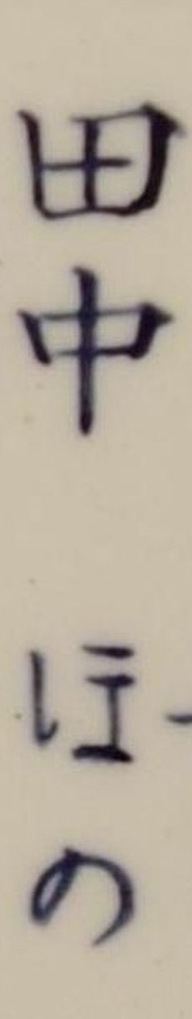田中ほの
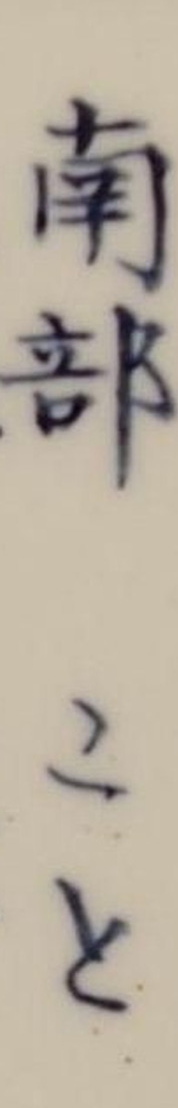南部こと
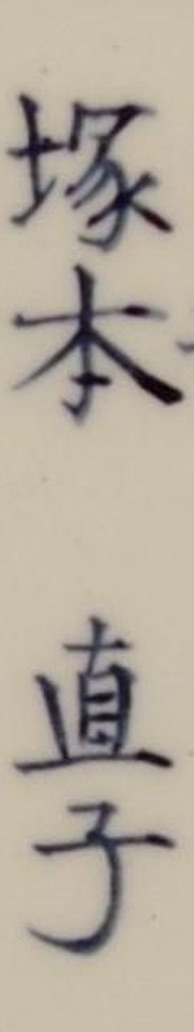塚本直子
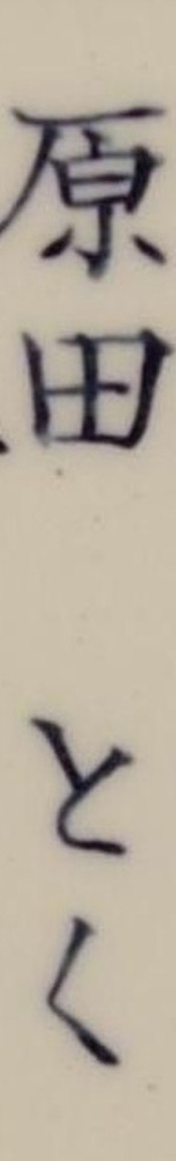原田とく
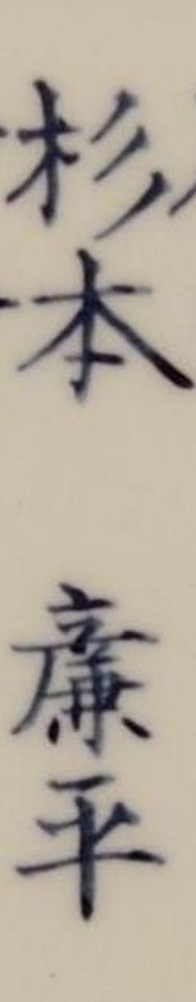杉本廉平
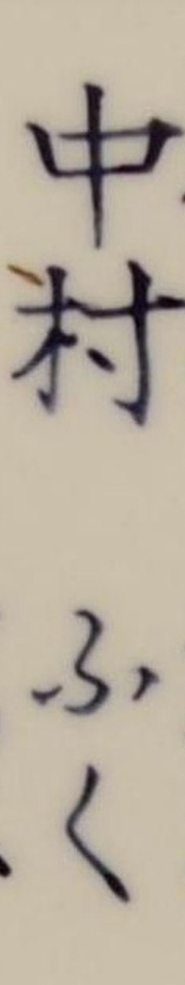中村ふく
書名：M~S
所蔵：高野山金剛峯寺
